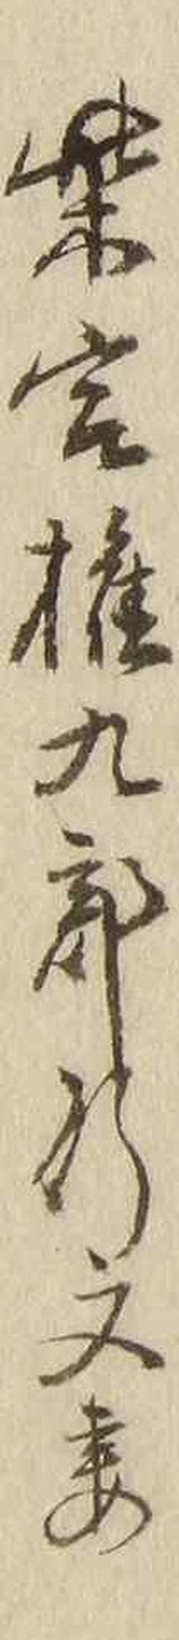女柴宮権九郎行文妻

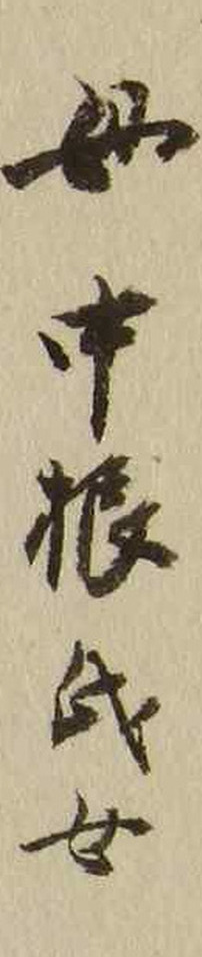母中根氏女
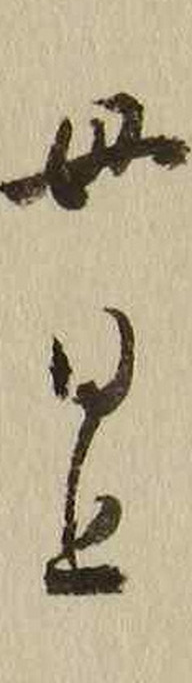母日上
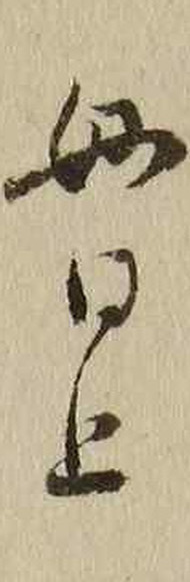母日上
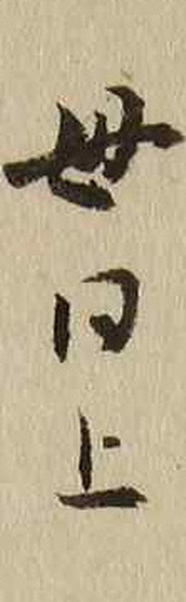母同上
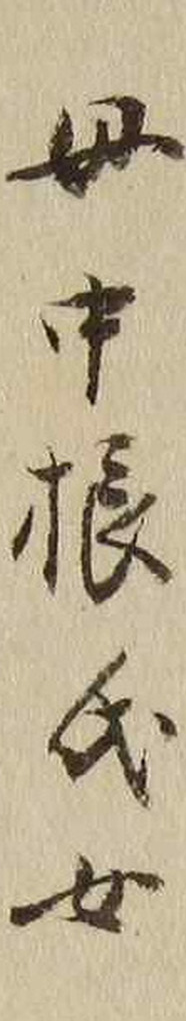母中根氏女
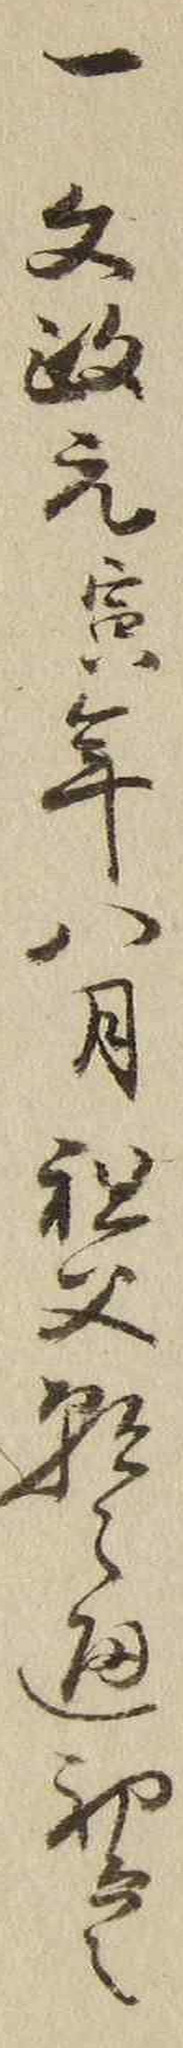一文政元寅年八月祖又願之通初而之
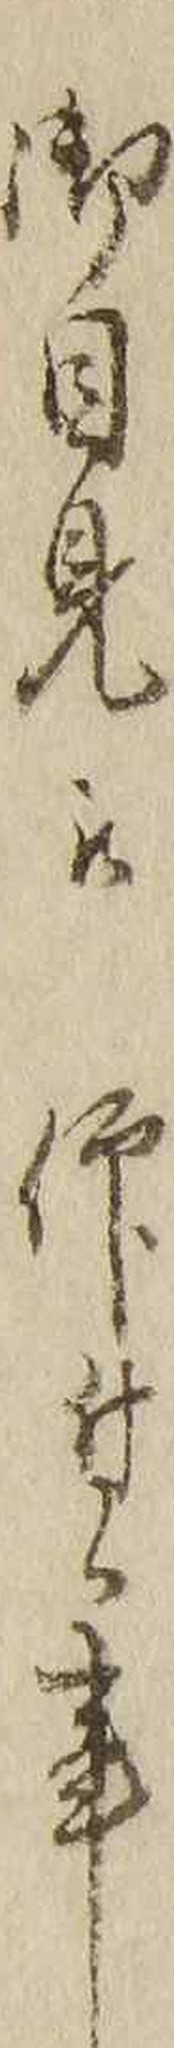御目見被仰付候事

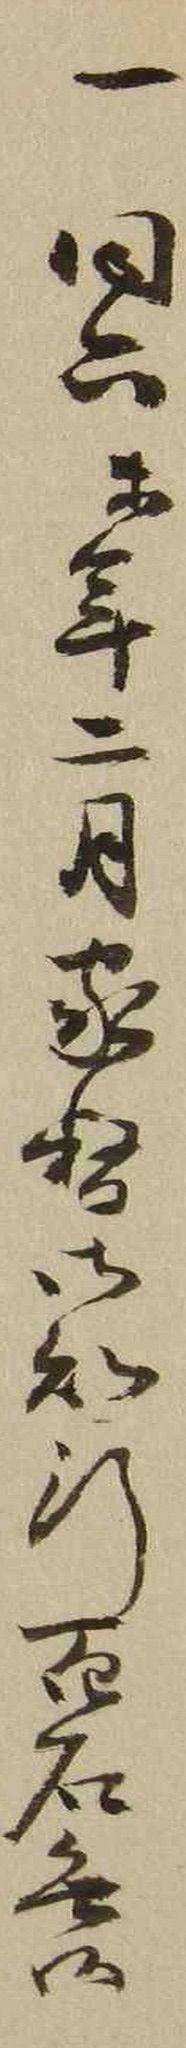一同六未年二月家督御知行百石無御
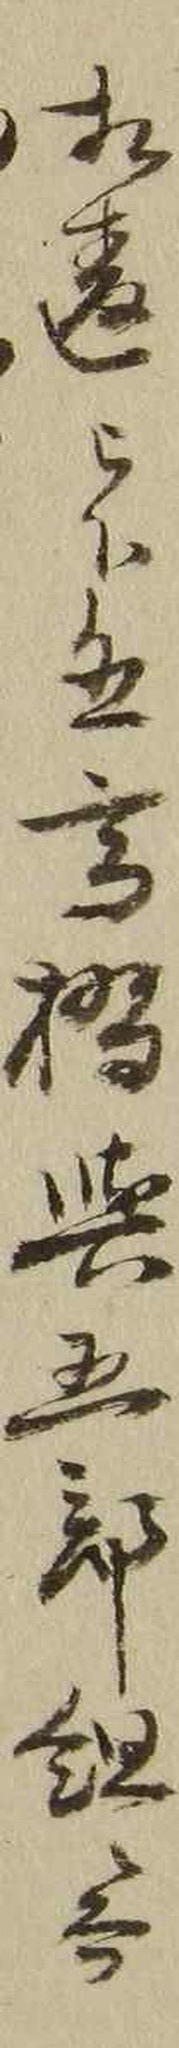相違被下置高摺与五郎組ニ而
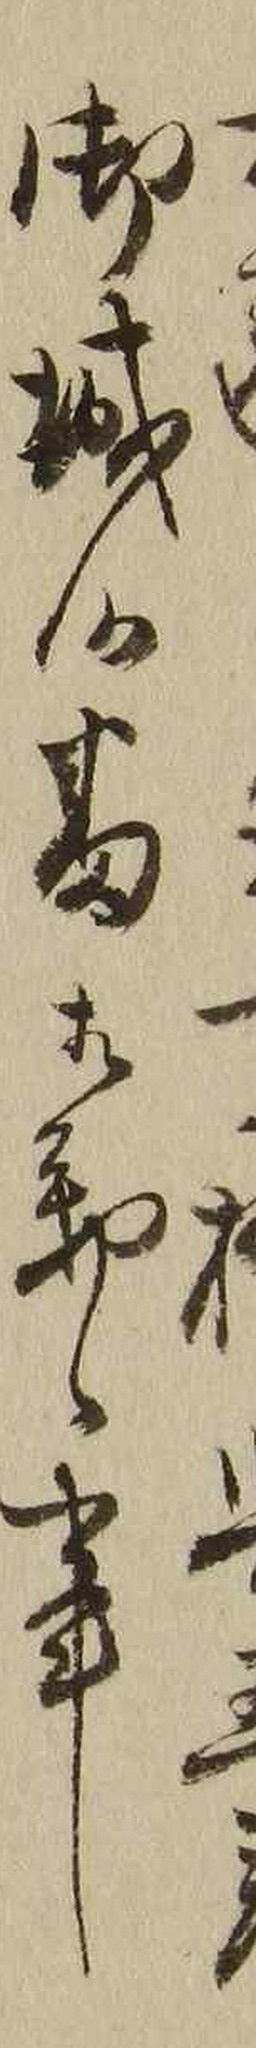御城御番相勤候事
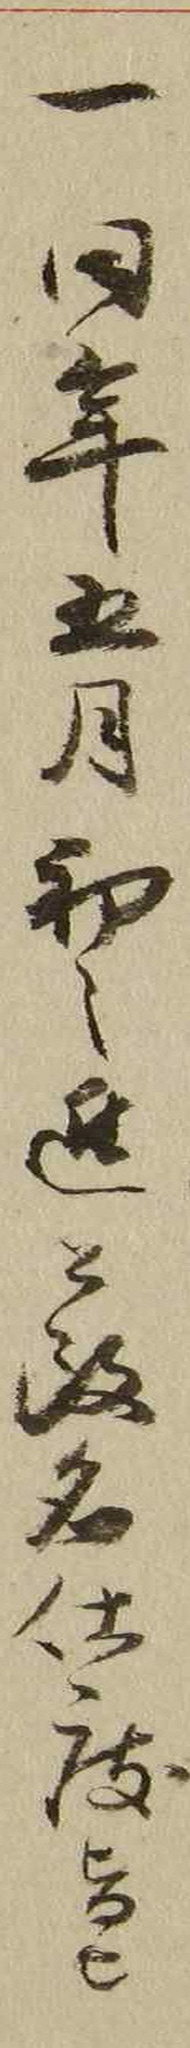一同年五月初之進と改名仕度旨被
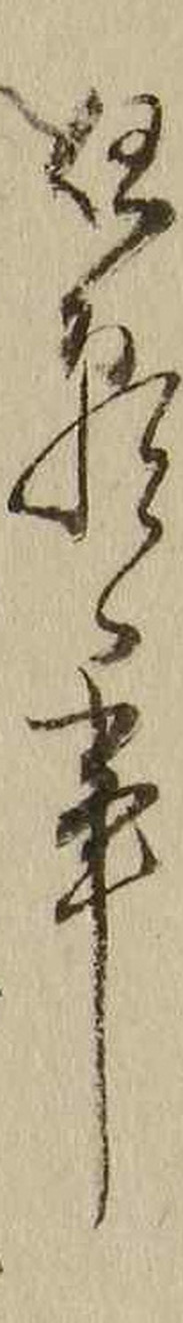任願候事
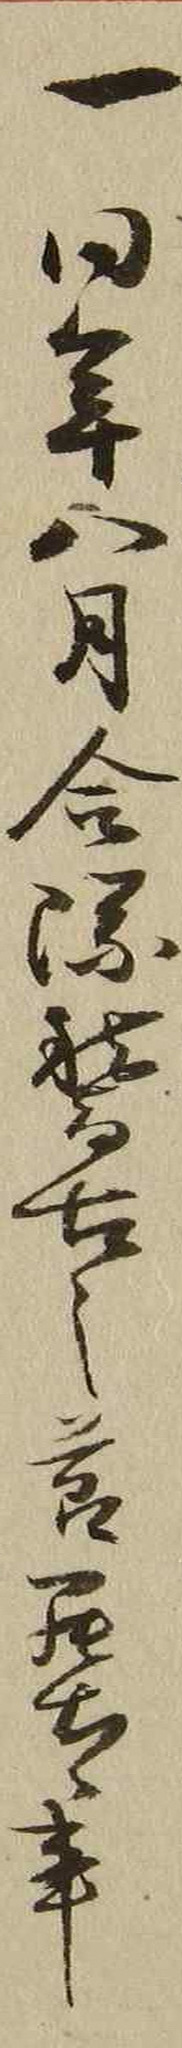一同年八月合隊稽古之節罷出候事
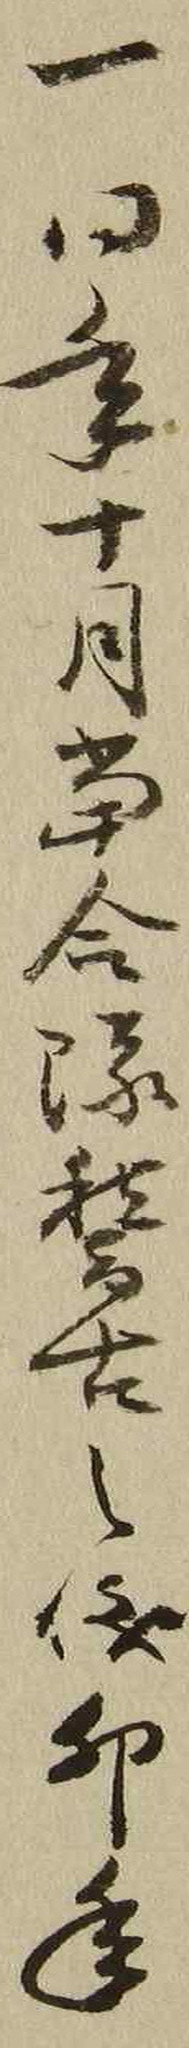一同年十月当合隊稽古之儀卯年
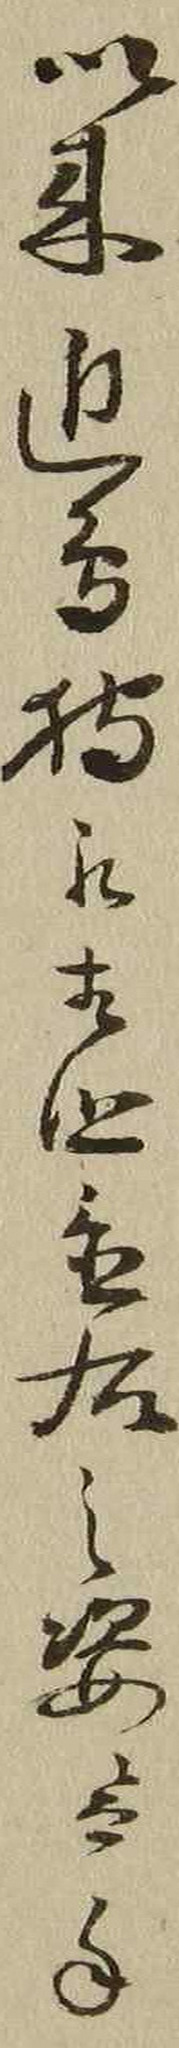以来追鳥狩被相止置右之姿ニ而手
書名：諸士系譜　巻之232　け之部1
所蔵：会津若松市立会津図書館
